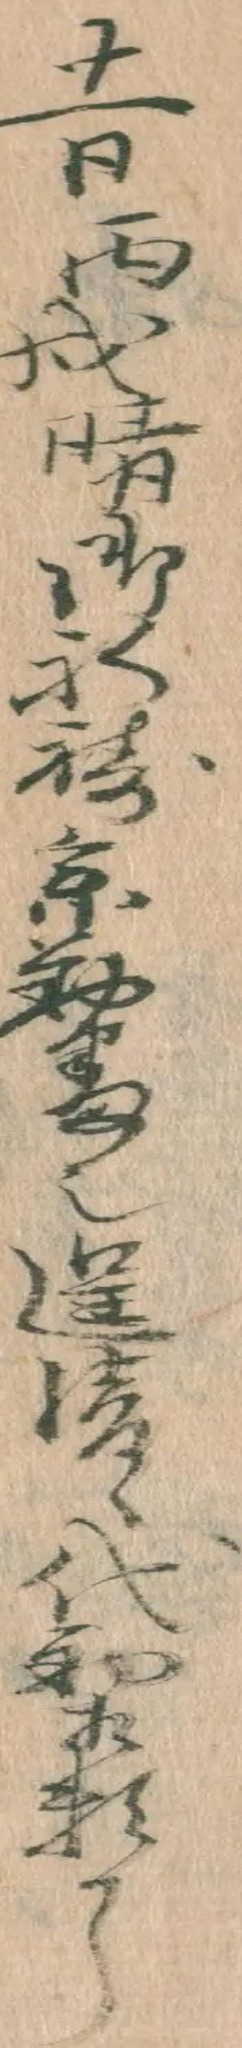十一日丙戌晴御祈祷参勤番也逞清代勤相頼了
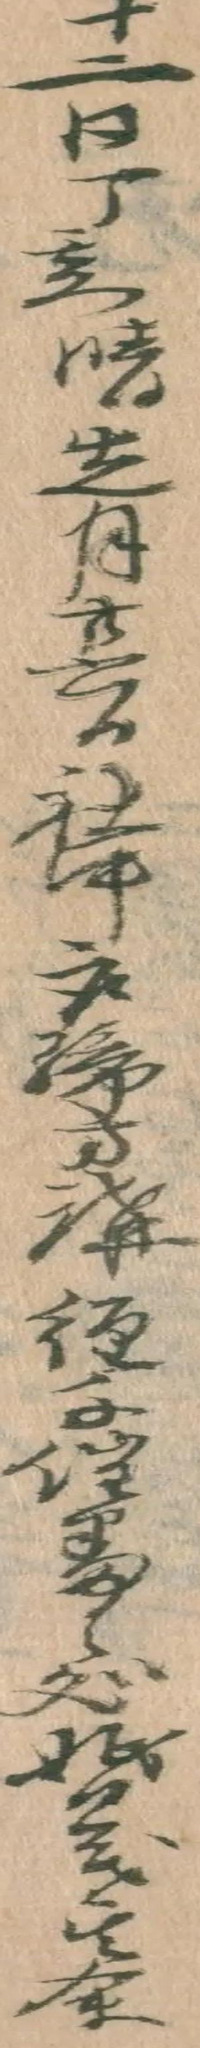十二日丁亥晴先月廿六日社中取締方講経千催番之処暫義其余
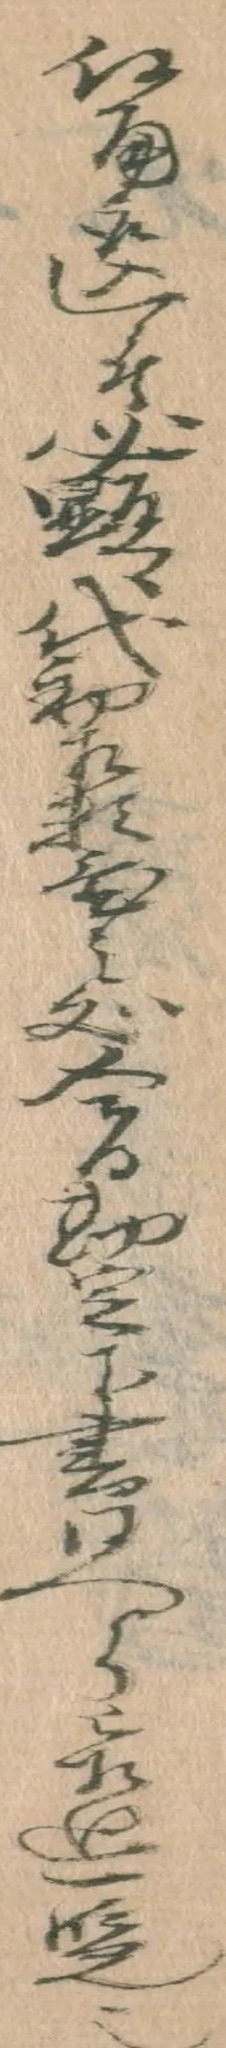何角取込候付必顕ヘ代勤相頼置之処今日勘定下書同人より被相廻一覧也
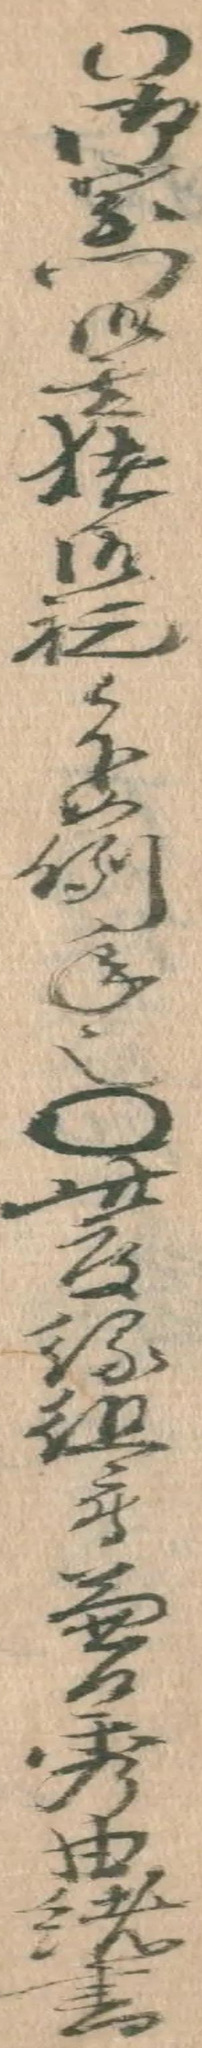○御家門御玄猪御祝被下如例年也○此度縁組ニ付兼日秀由諸書
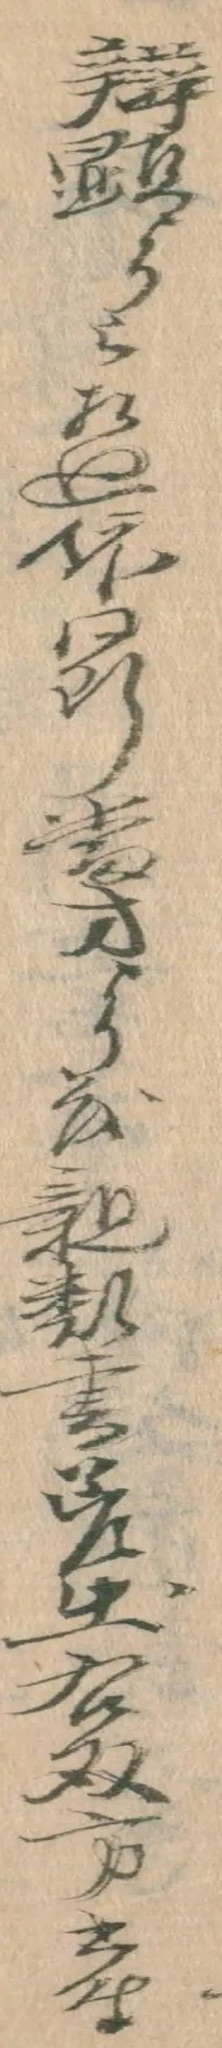辨顕より被相廻所同断當方よりも親類書差出右双方書付
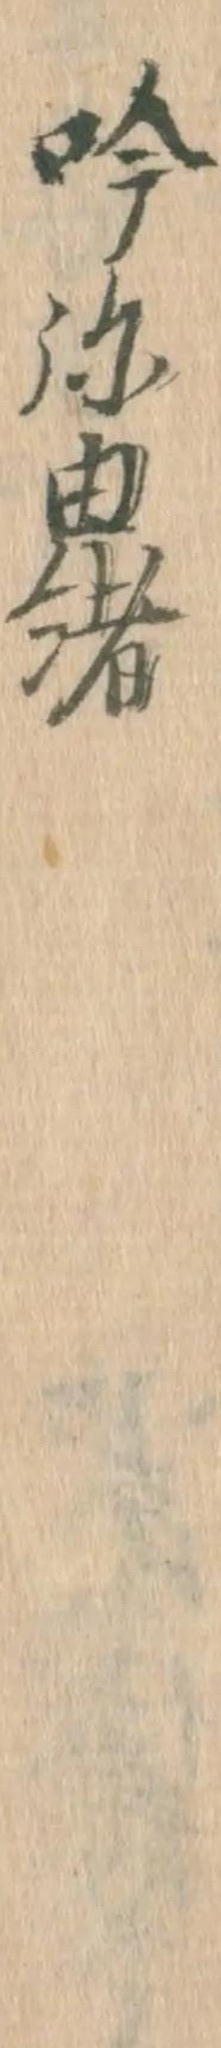吟弥由緒
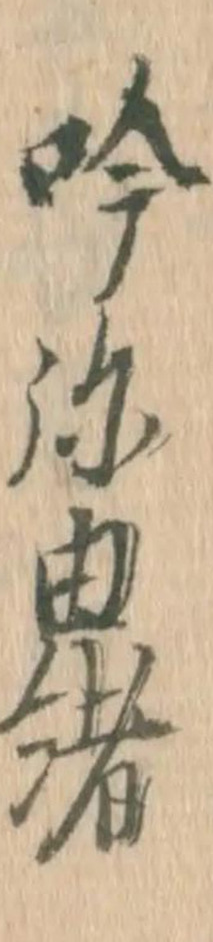吟弥由緒
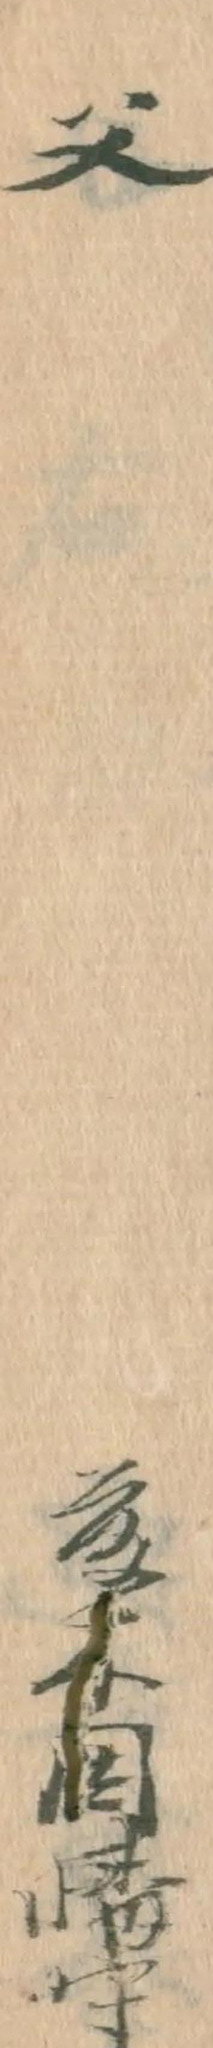父藤木因幡守

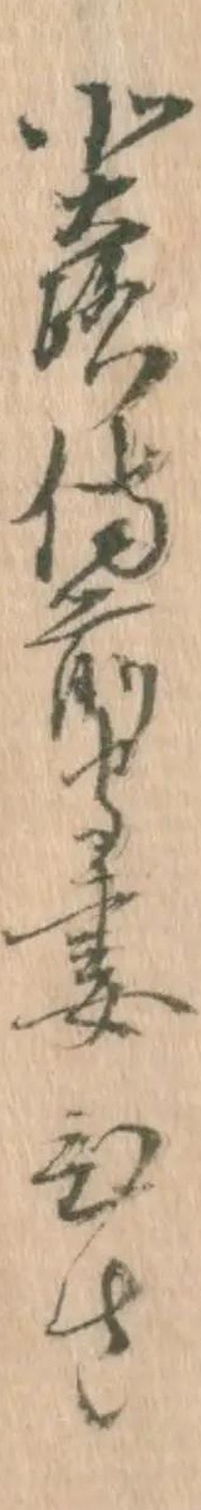姉北大路備前守妻ひさ
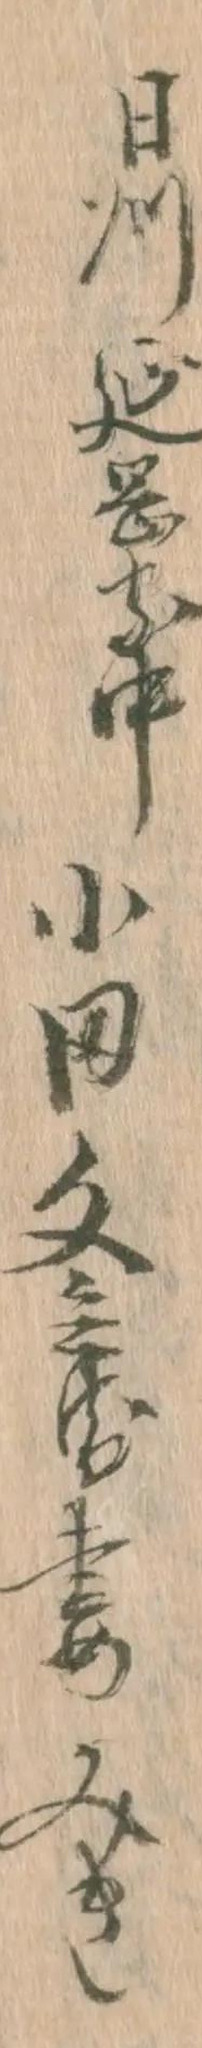姉日州延岡寺中小田文兵衛妻みき
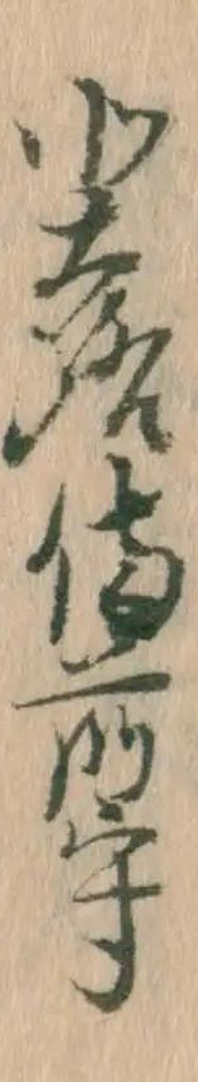一北土路備前守

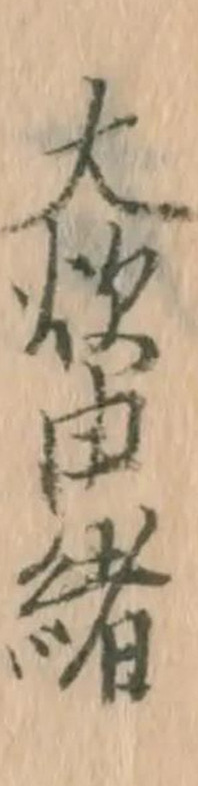大炊由緒

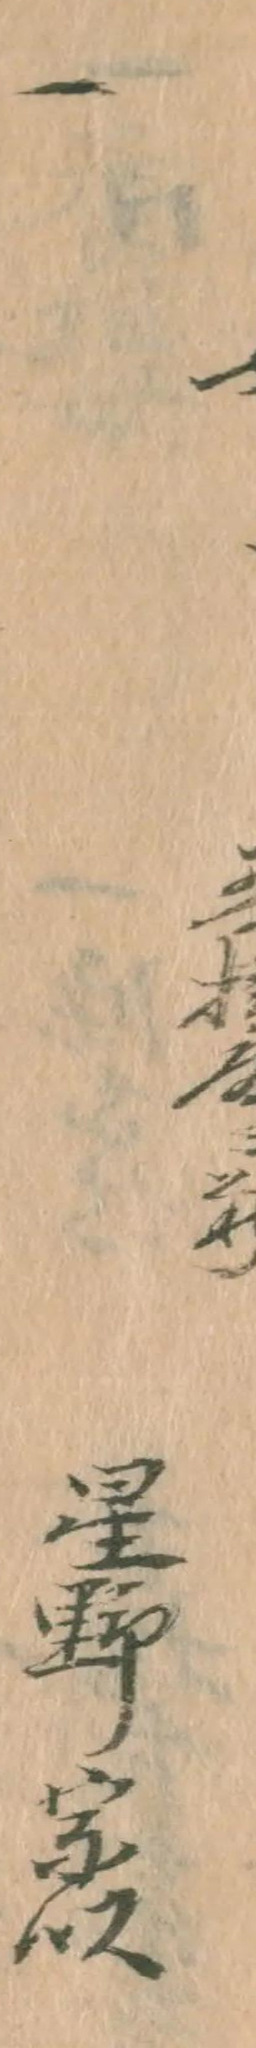一星野宗以
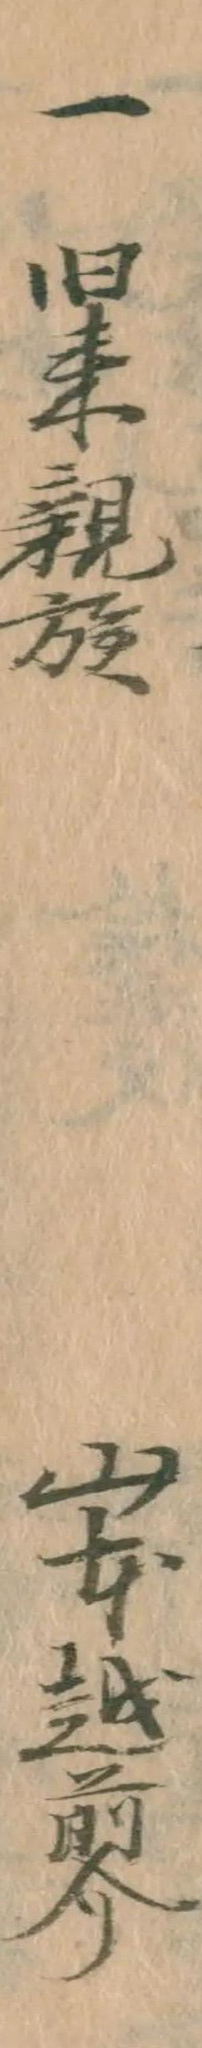一旧来親族山本越前介
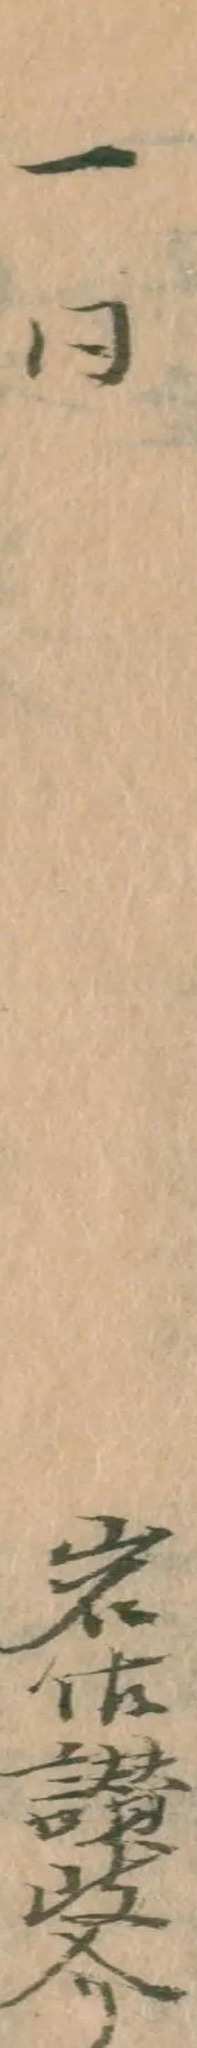一同岩佐讃岐介
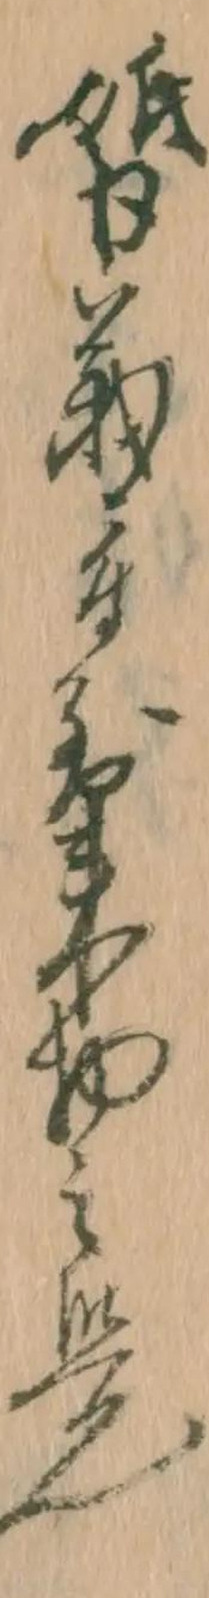婚義ニ付到来物之覚
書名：賀茂社記録. 第69冊
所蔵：国立国会図書館 National Diet Library, JAPAN
